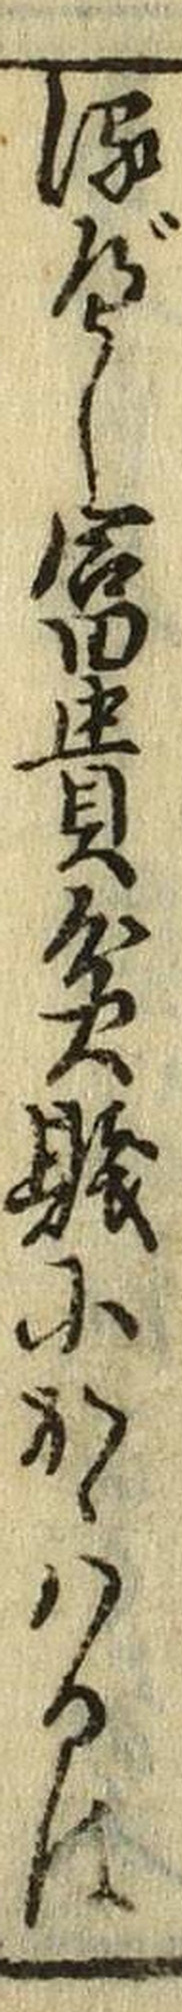るべし富貴貧賤にかゝはるは
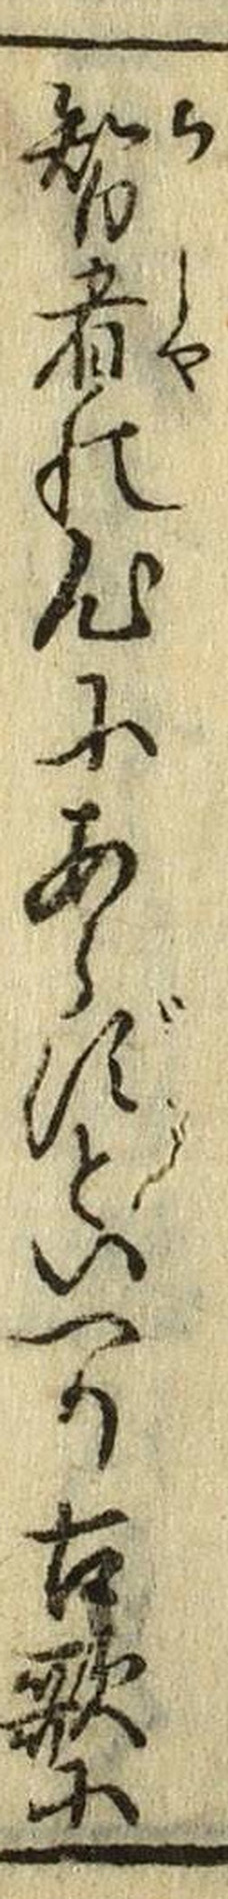智者の心にあらずといへり古歌に
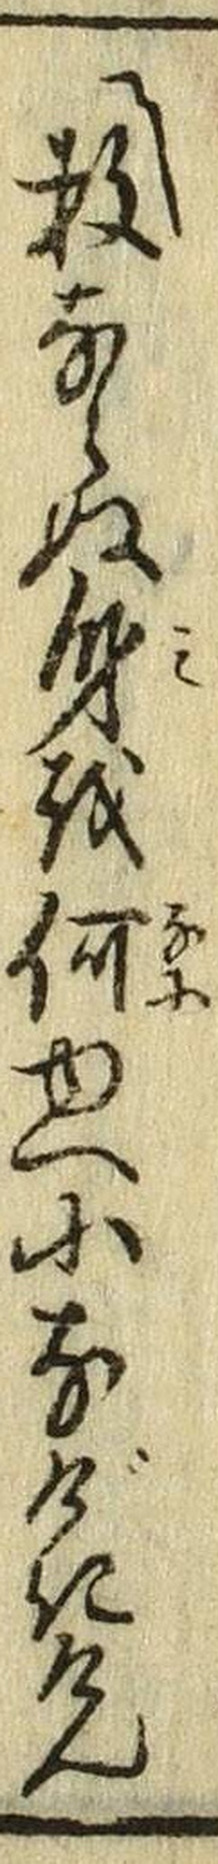〽数ならぬ身を何ゆへになげきけん
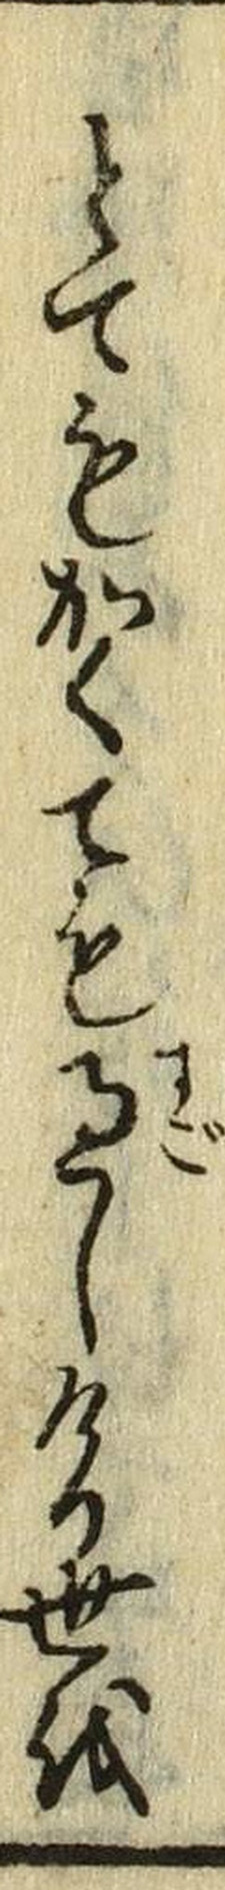とてもかくても過しける世を
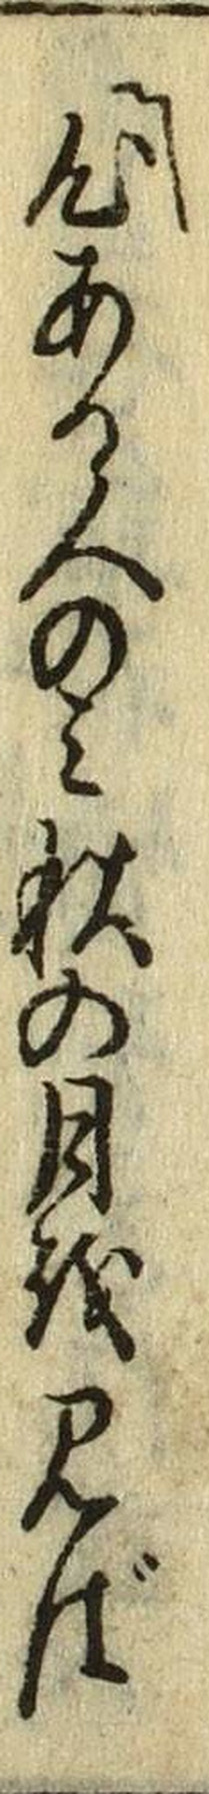〽心ある人のみ秋の月を見ば
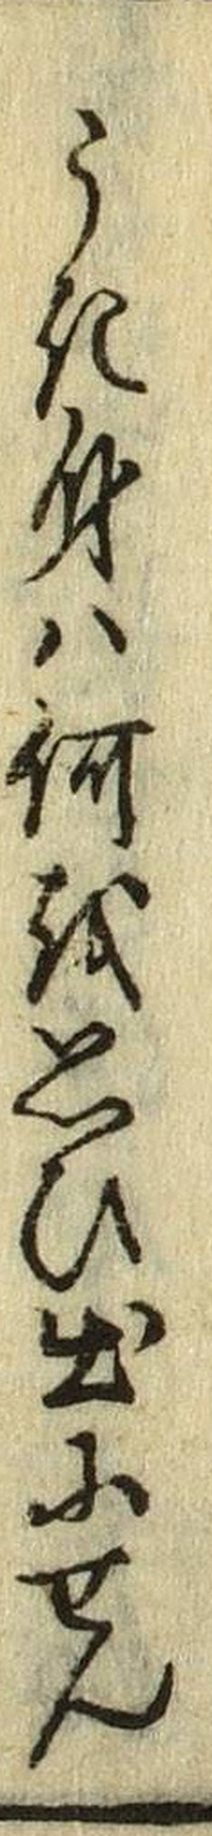うき身は何を思ひ出にせん
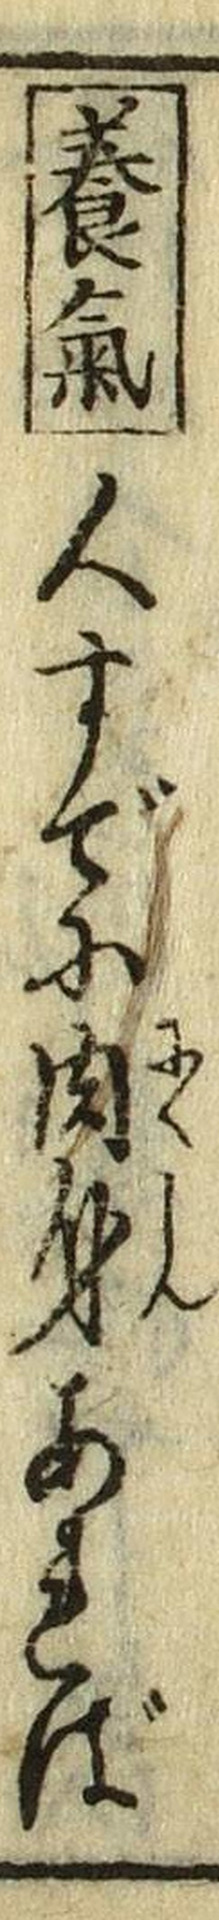養気人すでに肉親あれば
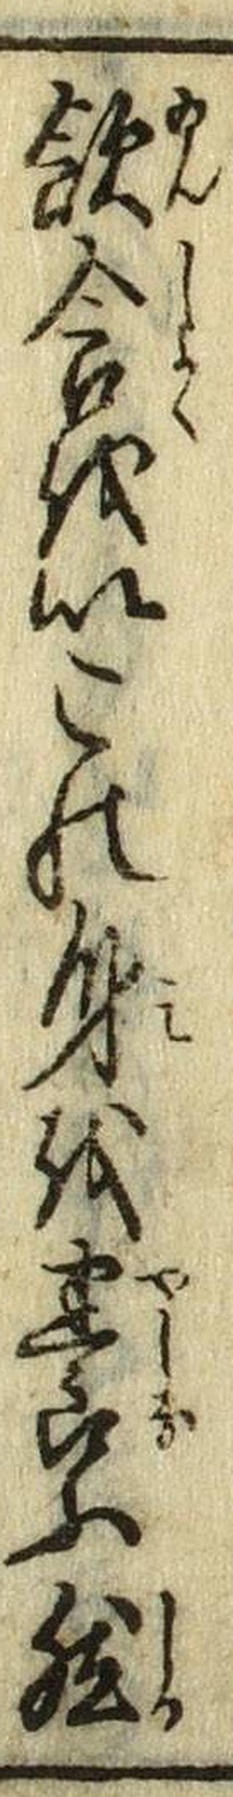飲食を以この身を養ふ然
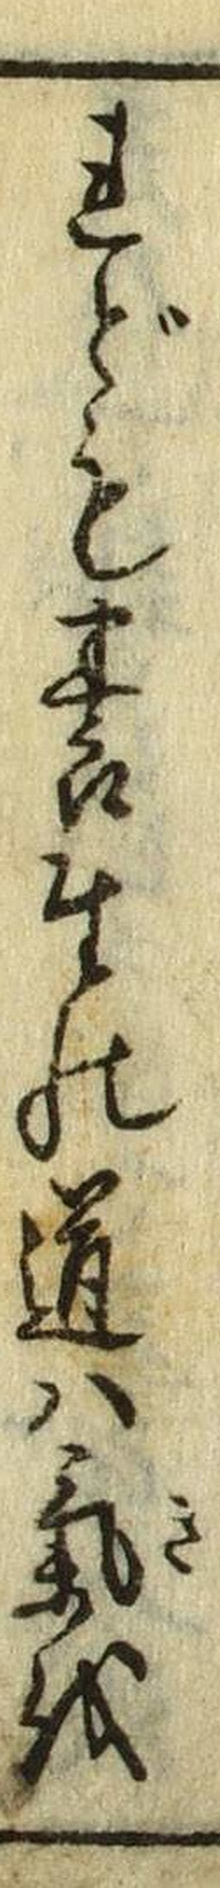れども養生の道は気を
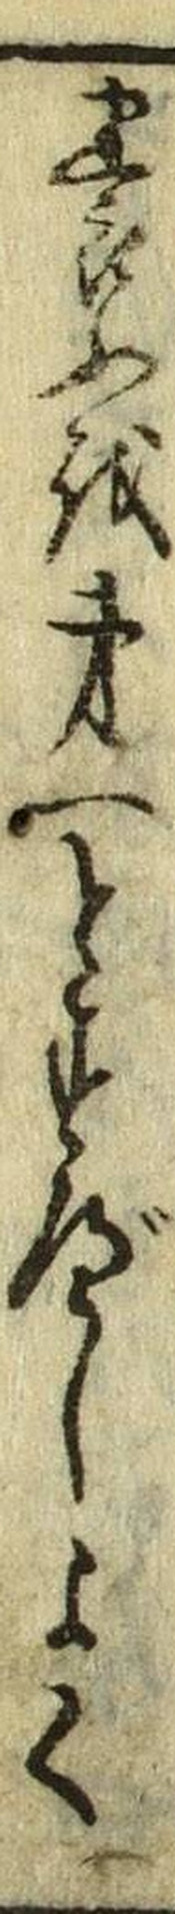養ふの第一とすべしよく
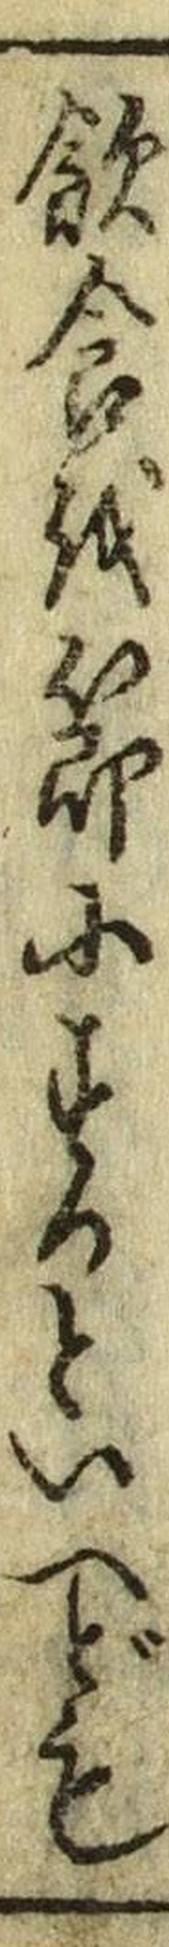飲食を節にするといへども

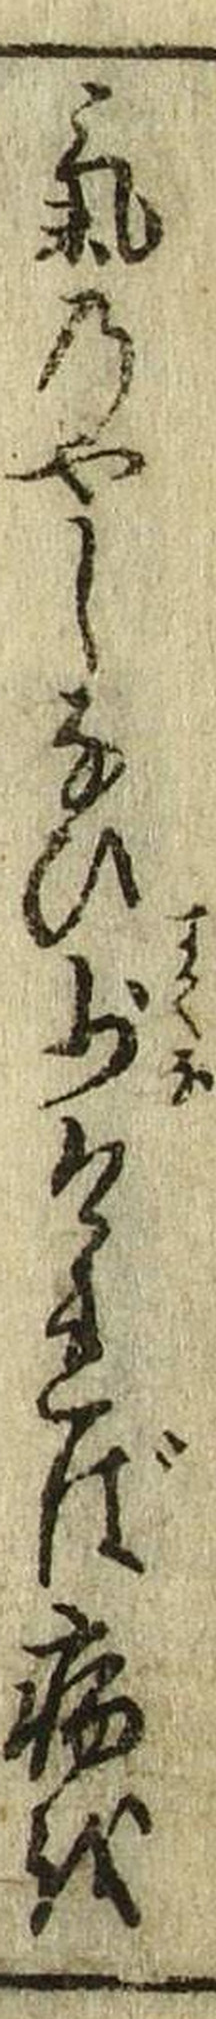気のやしなひ少けれべしば病を
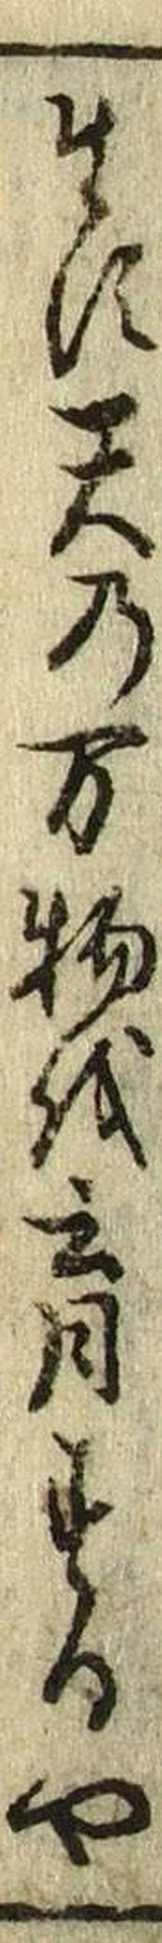生ず天の万物を育するや
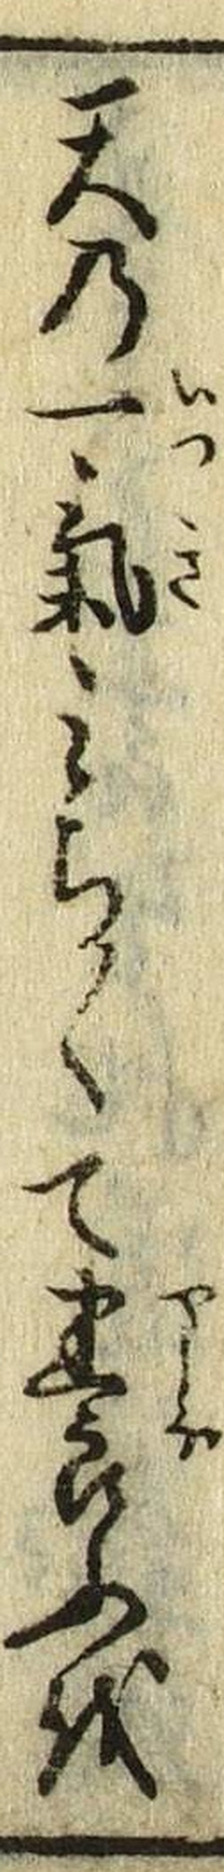天の一気みち〳〵て養ふを
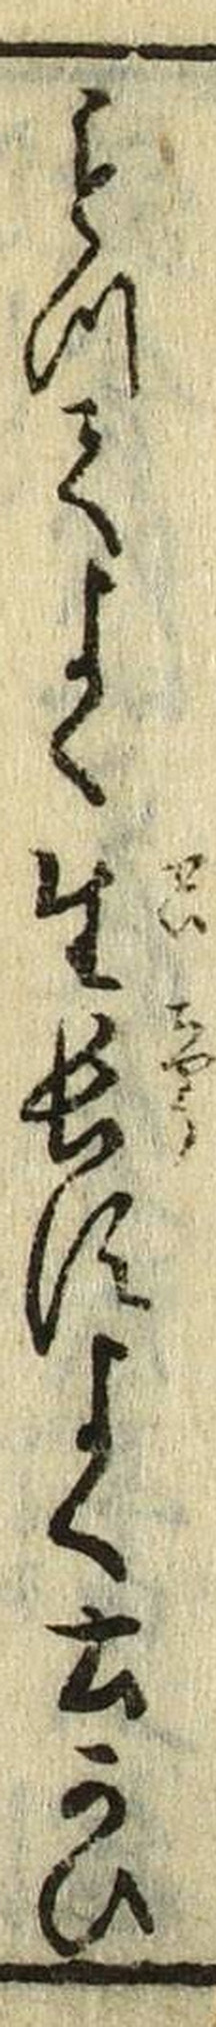もつてよく生長すよく土かい
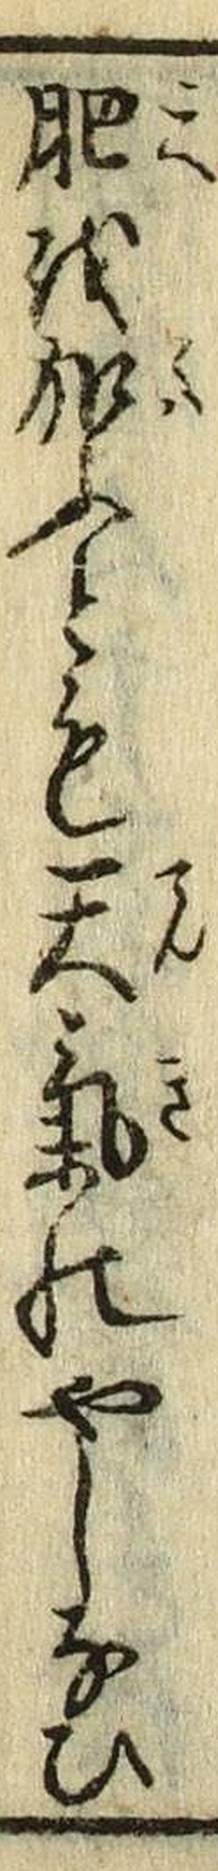肥を加ふとも天気のやしなひ
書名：居家養生記
